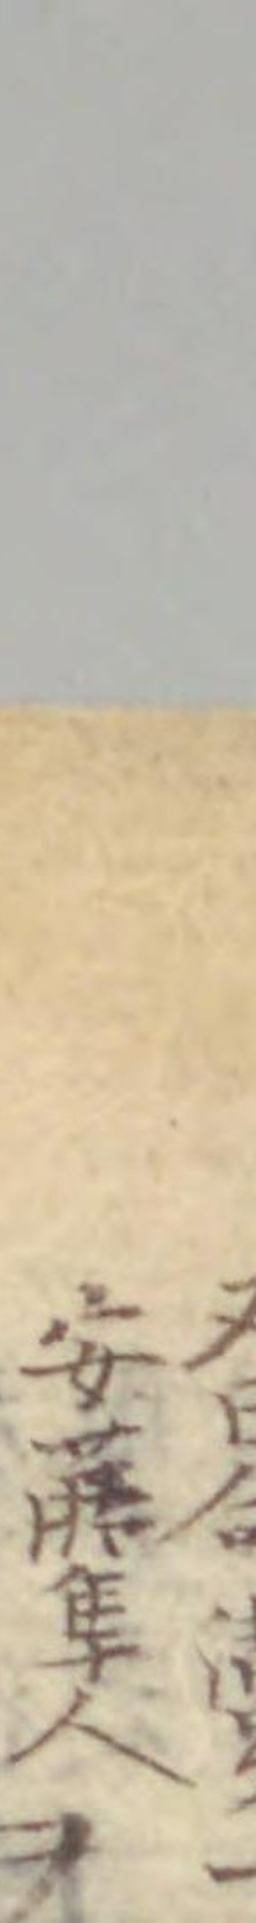安藤隼人
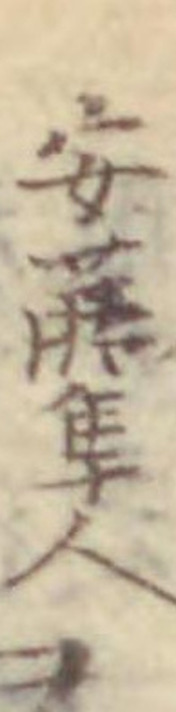安藤隼人
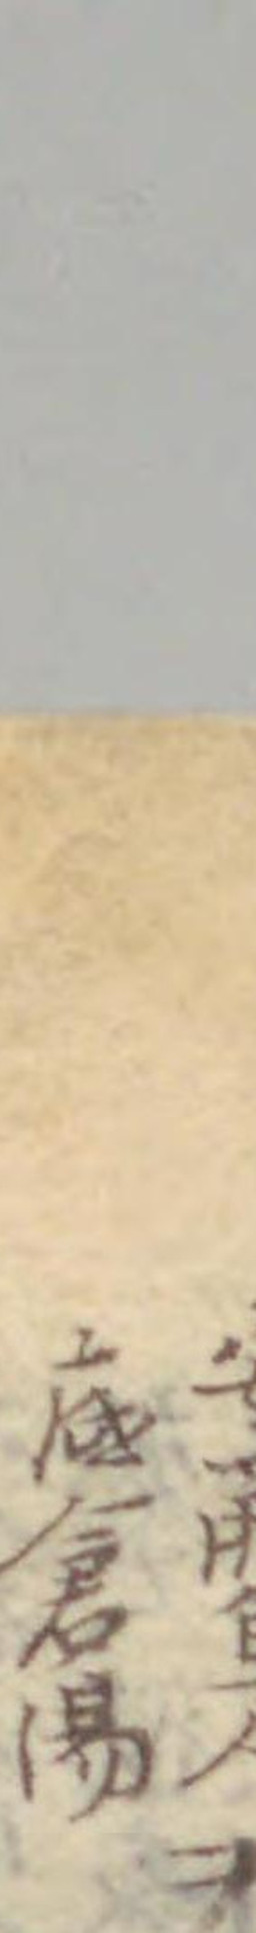底倉湯
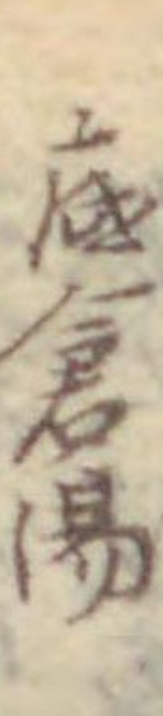底倉湯
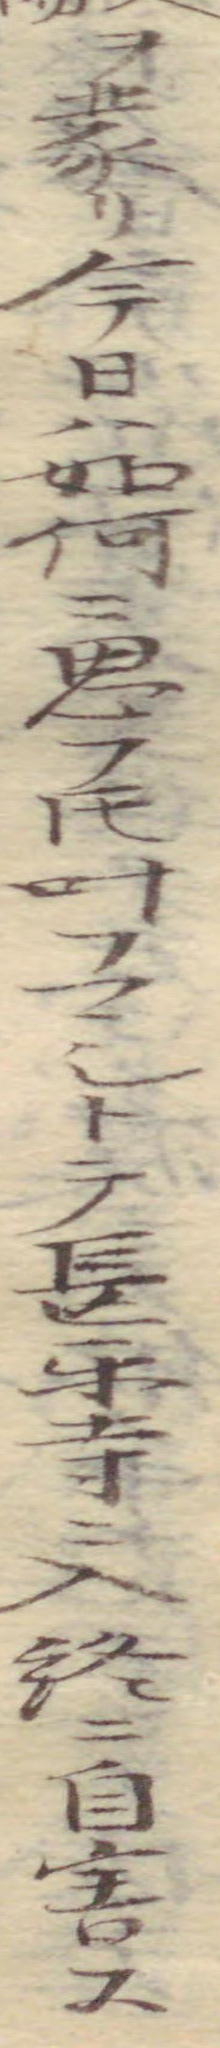ヲ蒙リ今日ハ如何ニ思フトモ叶フマシトテ長楽寺ニ入終ニ自害ス
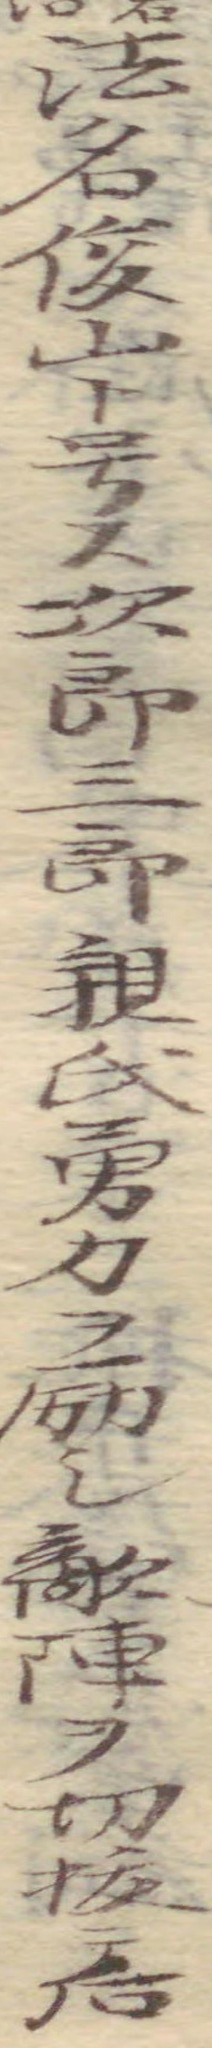法名俊山ト号ス次郎三郎親氏勇力ヲ励シ敵陣ヲ切抜ニ后
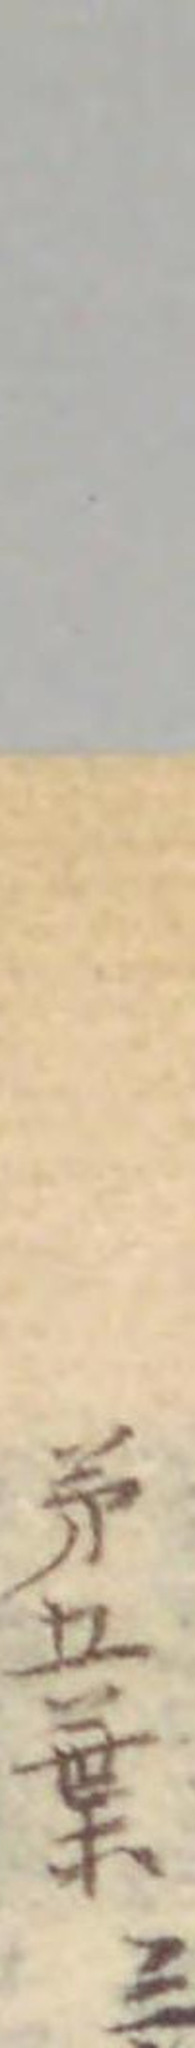第五葉
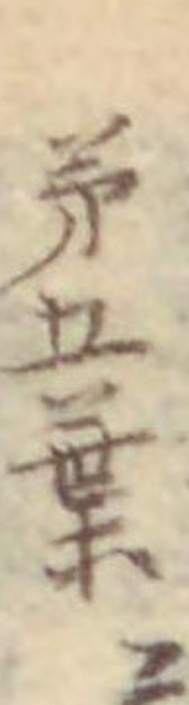第五葉
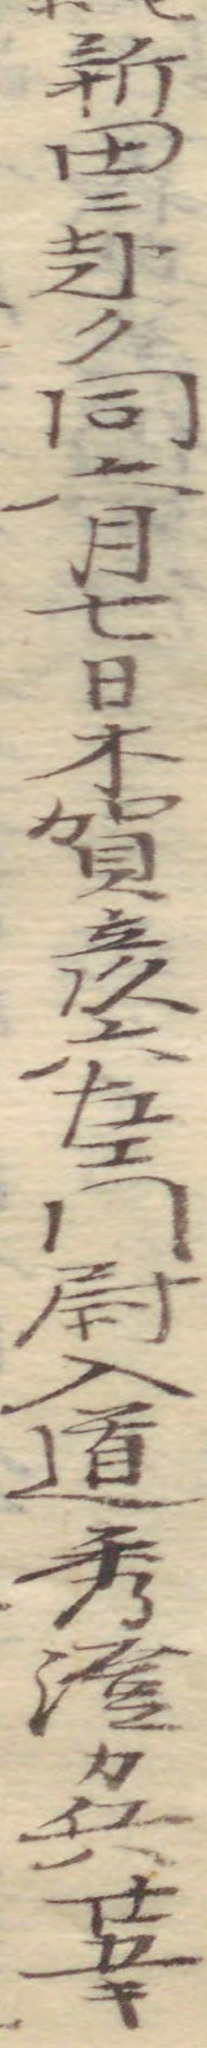新田ニ赴ク同六月七日木賀彦六左エ門尉入道秀澄カ兵廿五キ
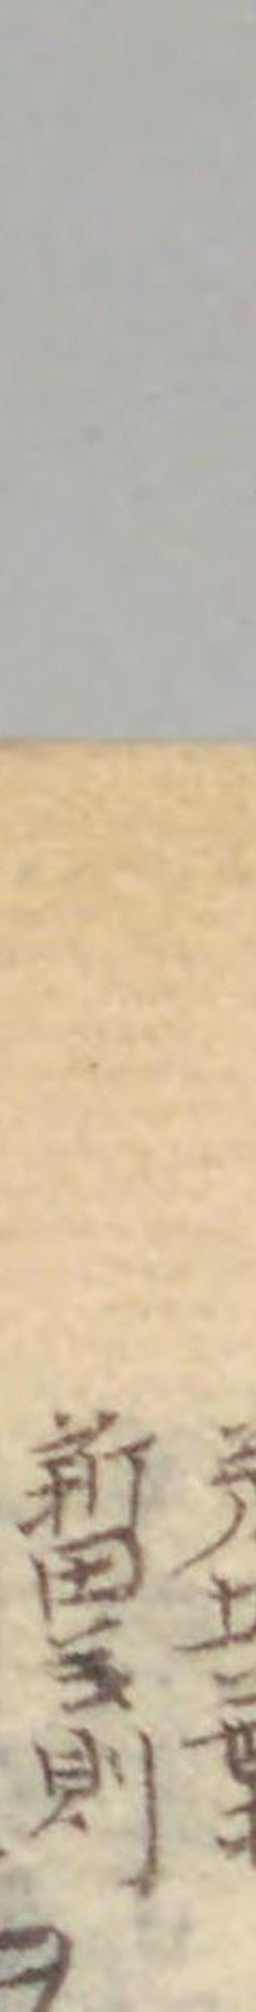新田義則
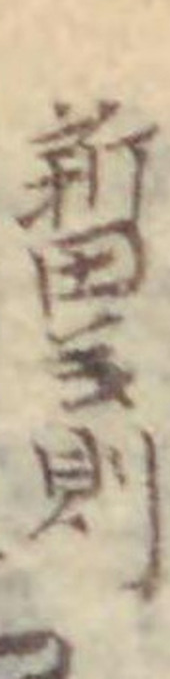新田義則
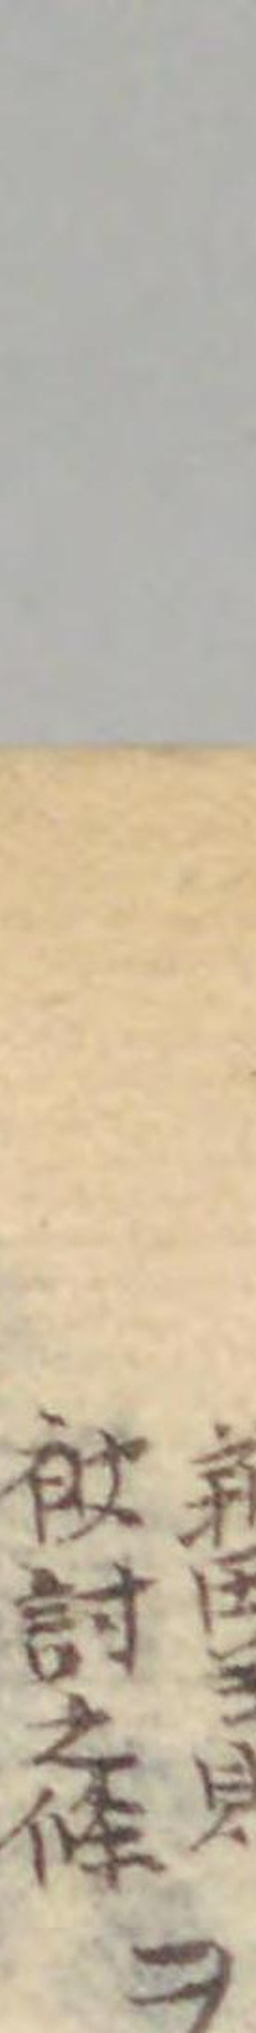被討之條
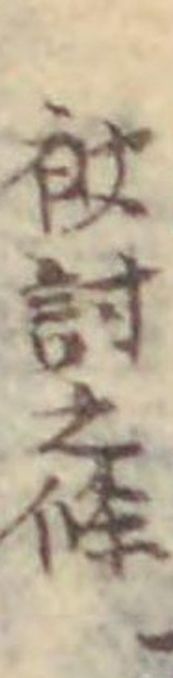被討之條
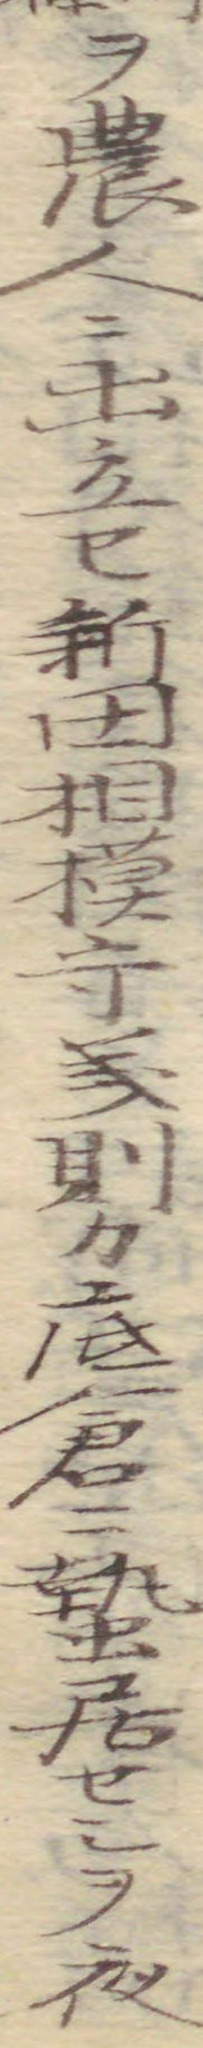ヲ農人ニ出立セ新田相模守義則カ底倉ニ蟄居セシヲ夜
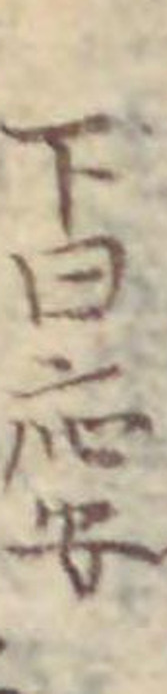下曰応安
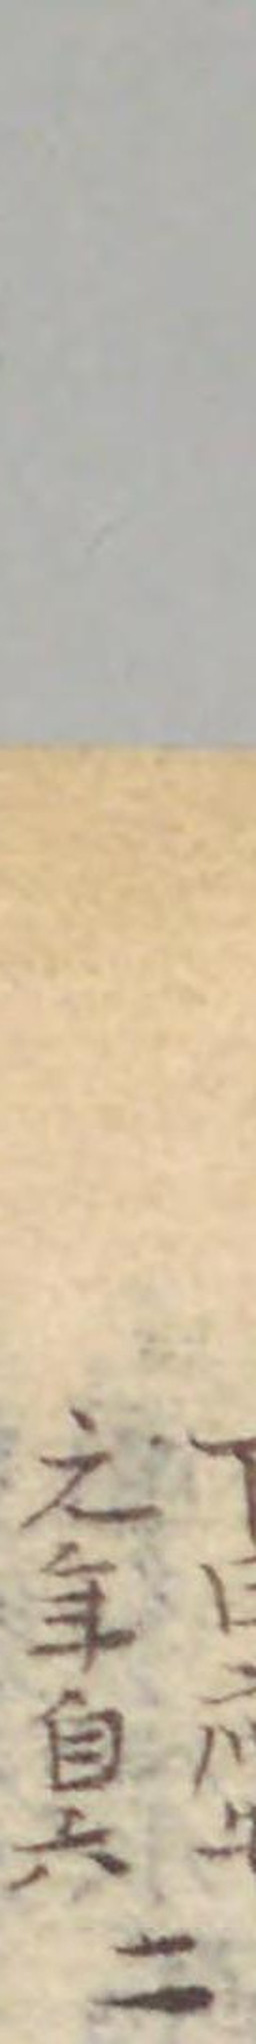元年自六
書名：鶯宿雑記. 巻199-200
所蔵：国立国会図書館 National Diet Library, JAPAN
